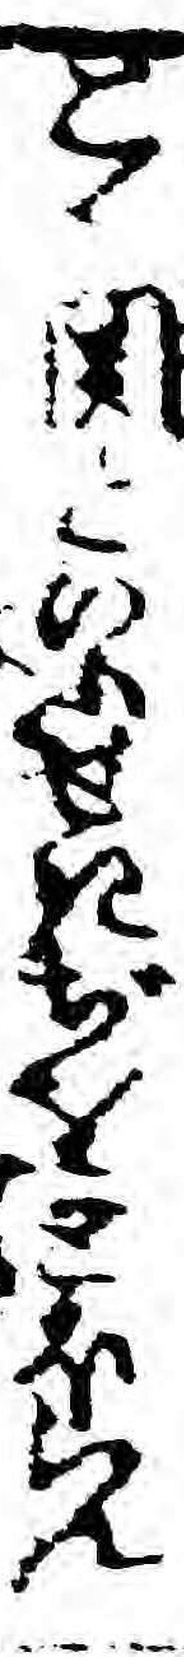こく関といふせきぢをとほらん
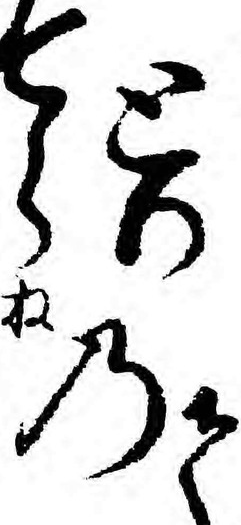とりの
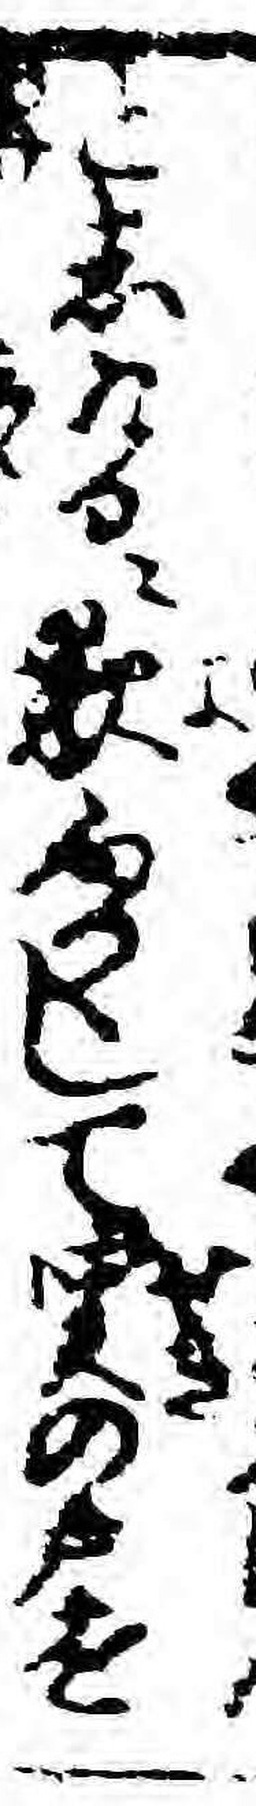としけるに夜ふかくして関の戸を
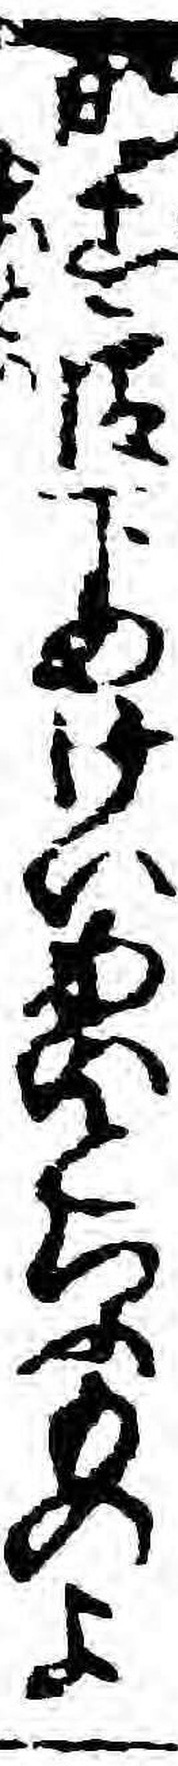明ず臣下のけいめいといふものよ
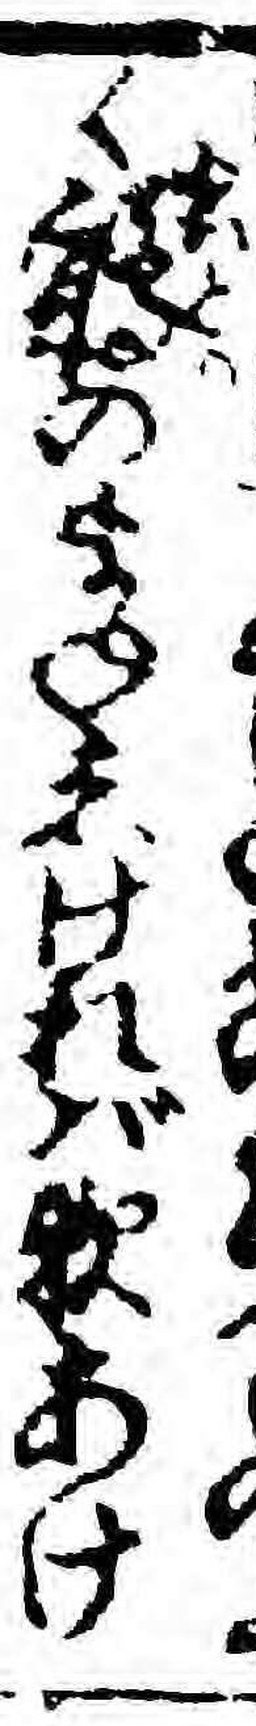く鶏のまねしければ夜あけ
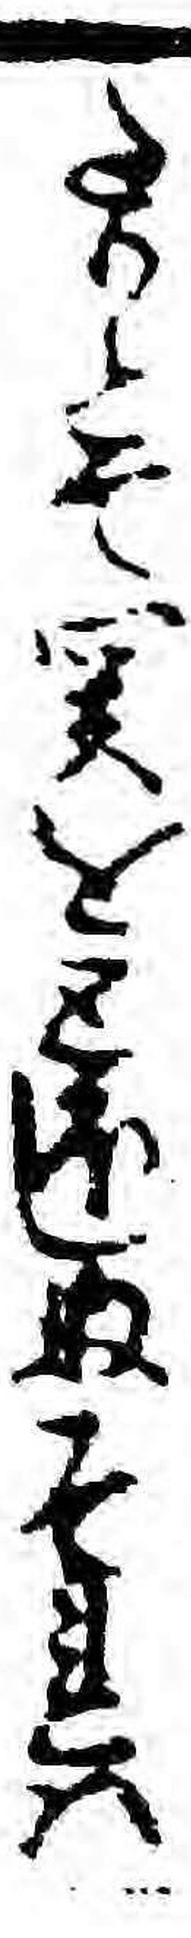たりとて関をとほしぬそれは
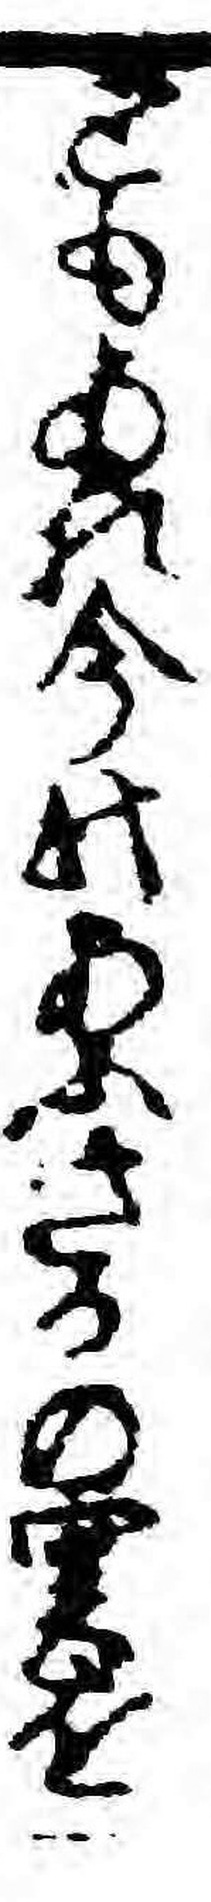ともあれ今此あふさかの関を
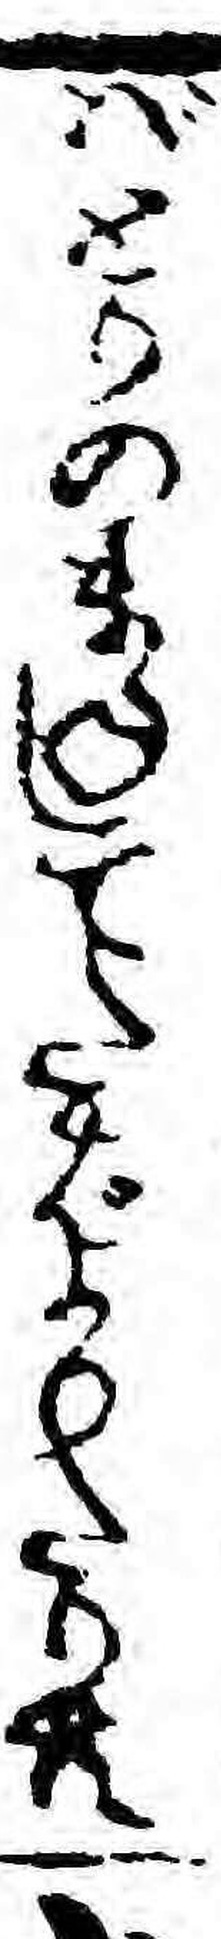ばとりのまねしてたばかりたり共
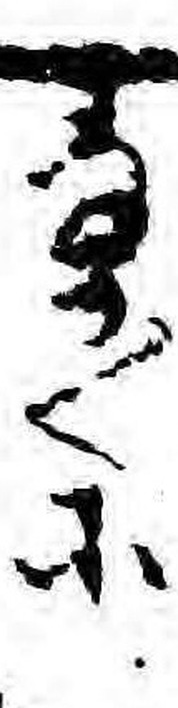なか〳〵に
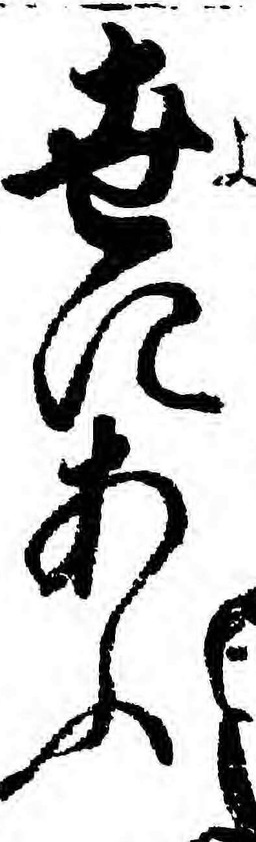世にあふ
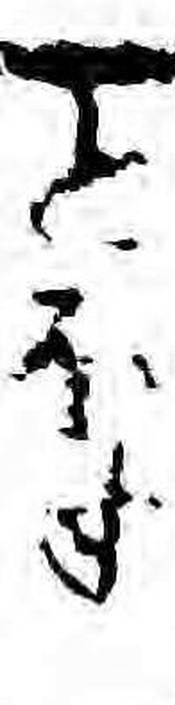とほす
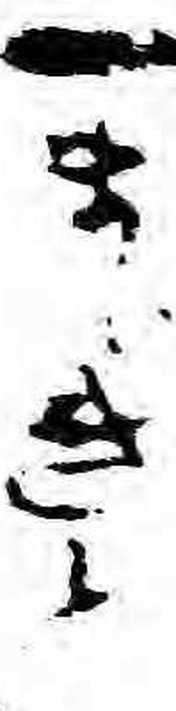まじきと
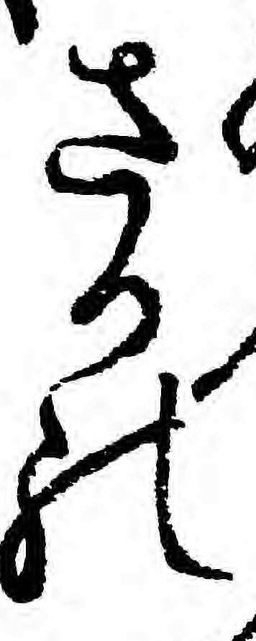さかの
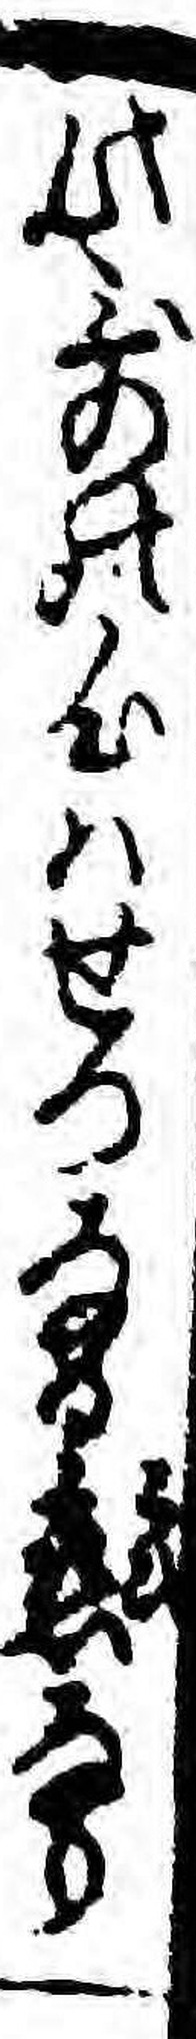此哥の心はせつなる恋なり
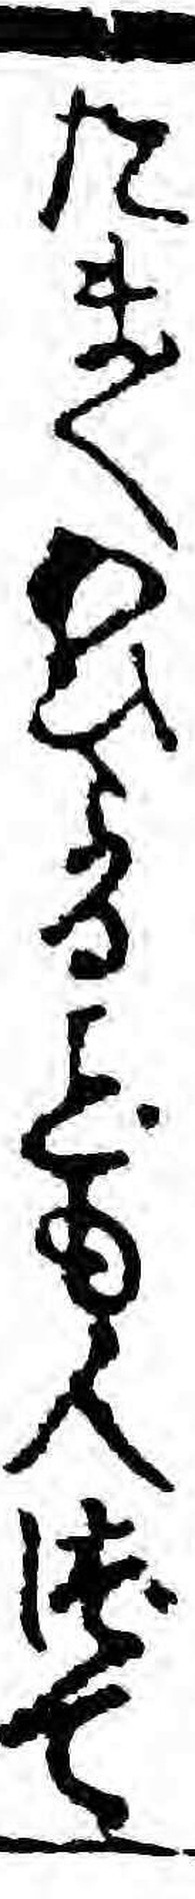たま〳〵いひよることも人づて
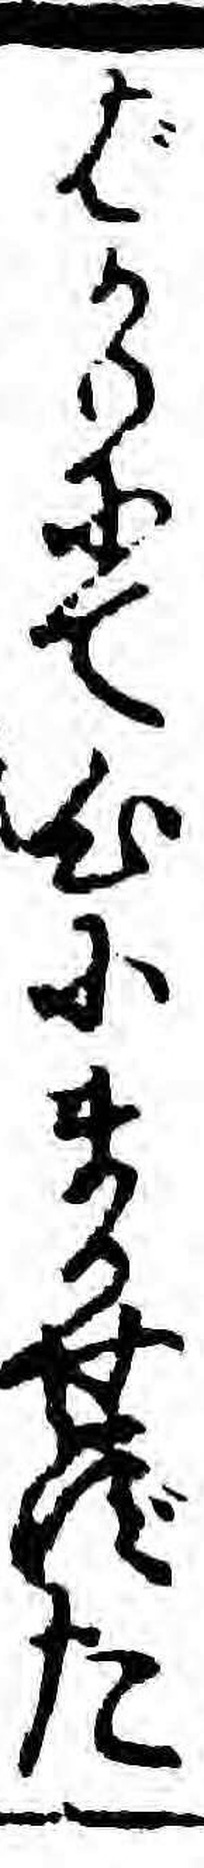ばかりにて心にまかせずた
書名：頭書和歌注譯／壽賀多百人一首小倉錦
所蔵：国文学研究資料館
